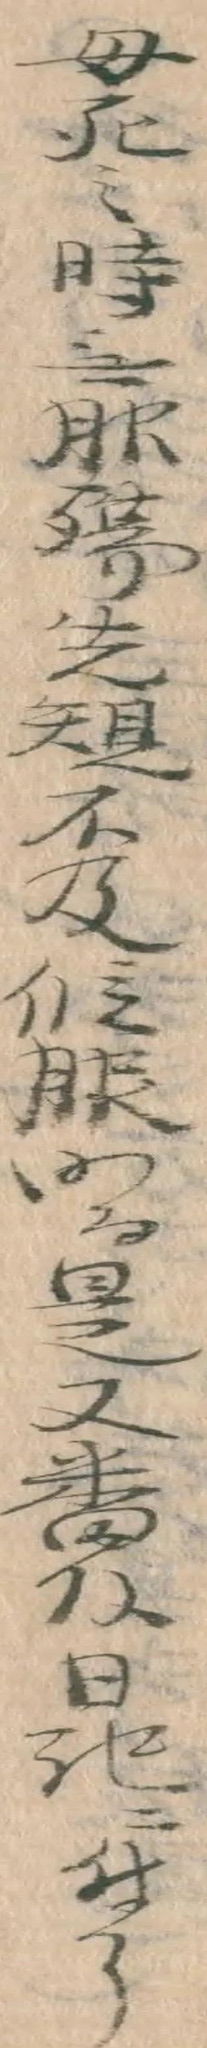母死之時無服殤先規不及段服仍而是又番頭日記ニ付了
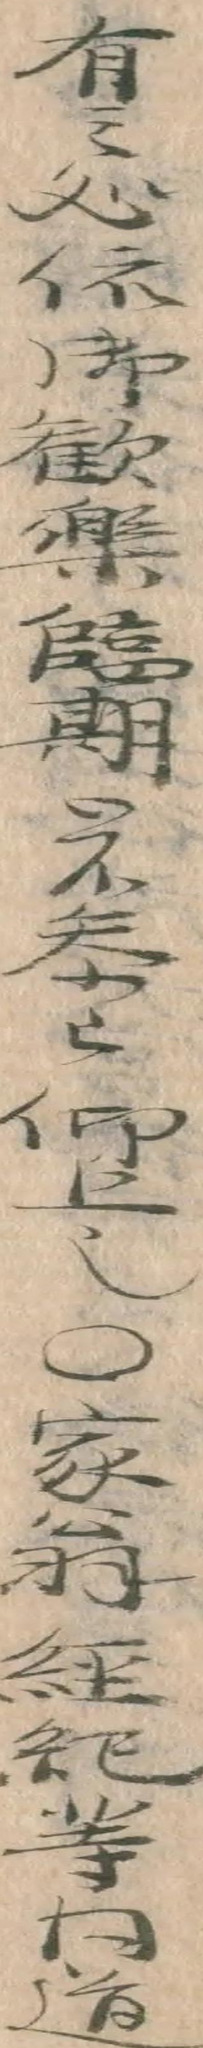有之処依御歓楽臨期御不参被仰上也○家翁経紀等同道
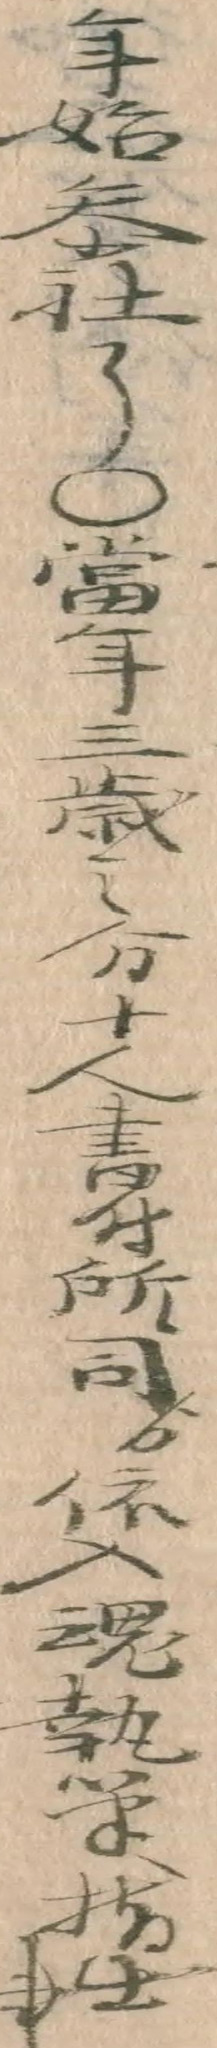年始参社了○當年三歳之分十人書付所司ゟ依入魂執筆ヘ指出事
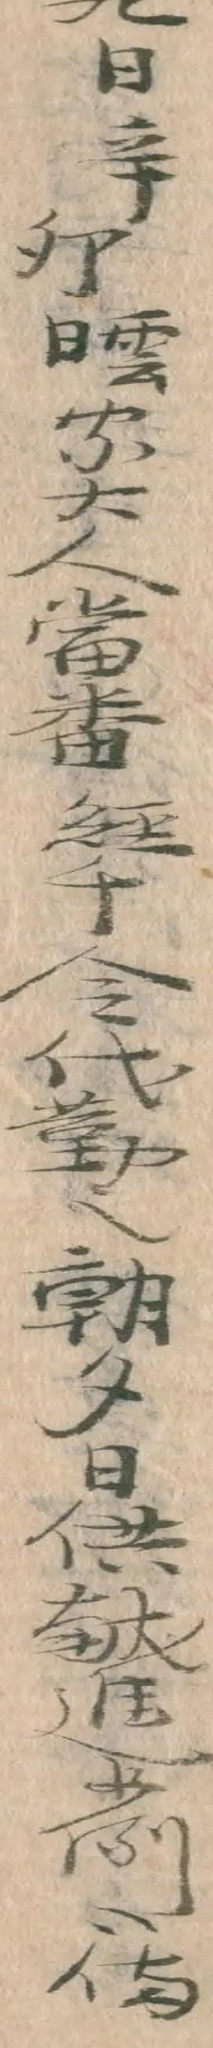九日辛卯曇家大人當番経千令代勤也朝夕日供献進如例御備
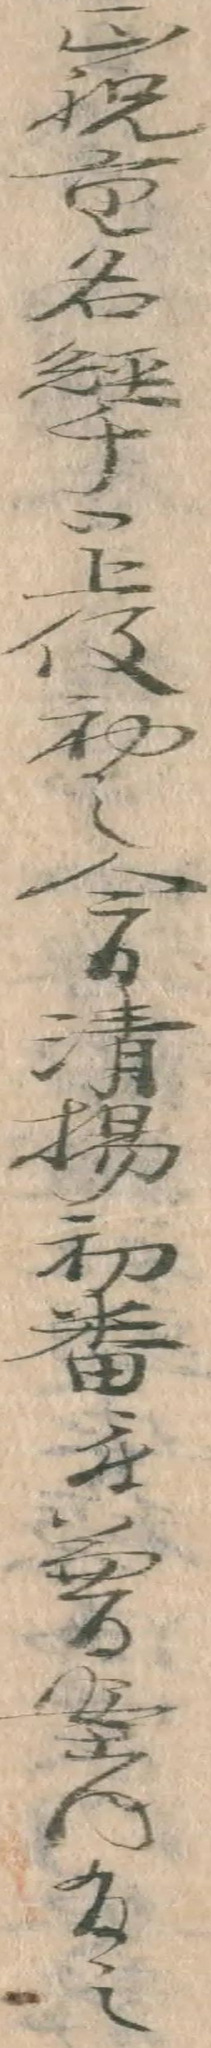正祝重名経千御上役初也今日清揚初番ニ付兼而案内有之
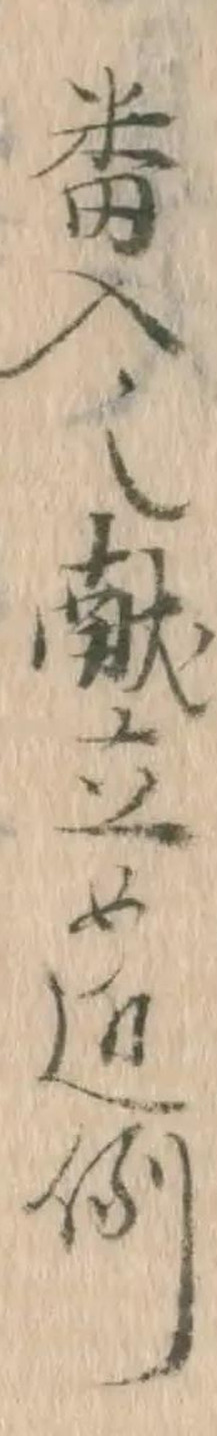番入之献立如近例
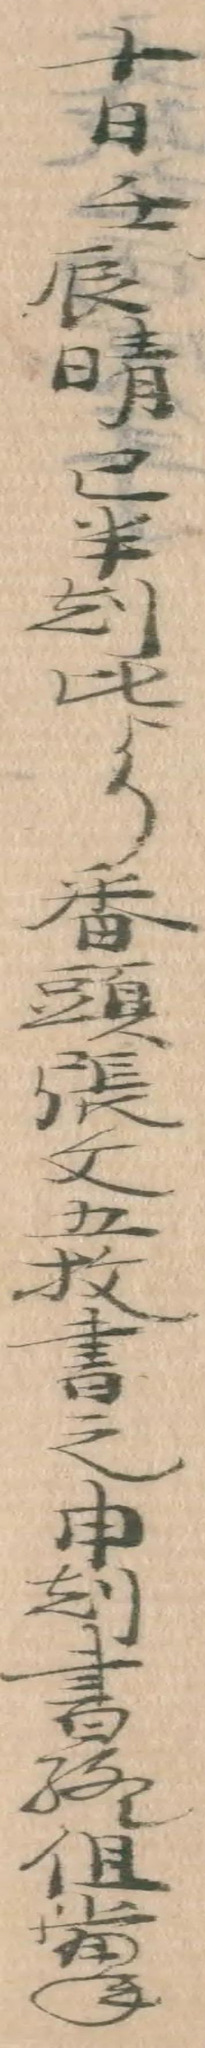十日壬辰晴巳半刻比より番頭張文五枚書之申刻書終但當年
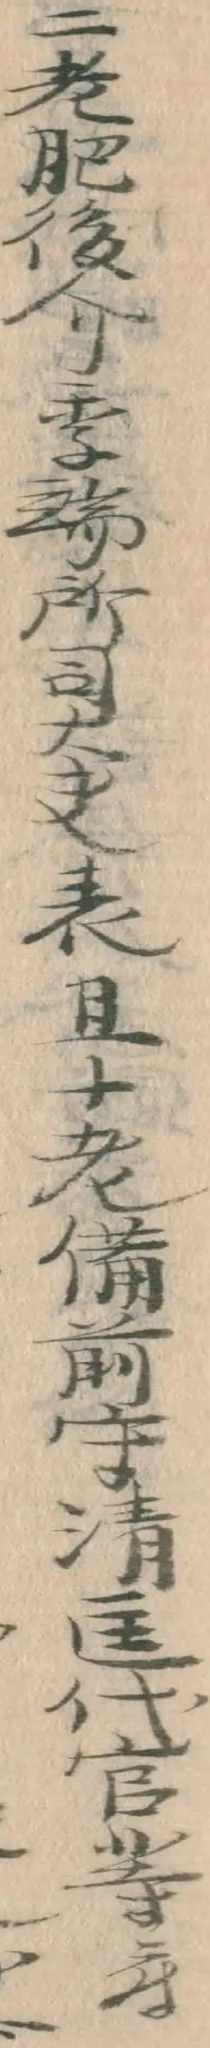ニ老肥後介季端所司大夫表且十老備前守清匡代官等ニ付
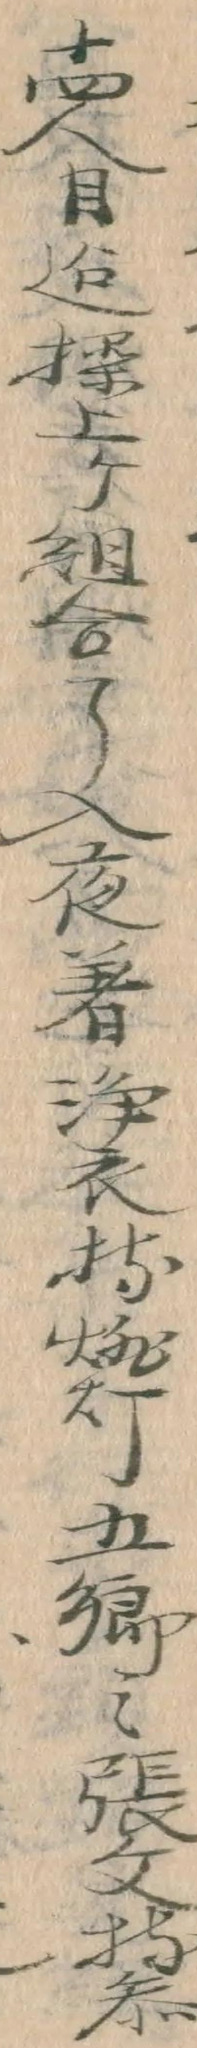十四人目迄操上ケ組合了入夜着浄花持燃灯五郷之張文持参
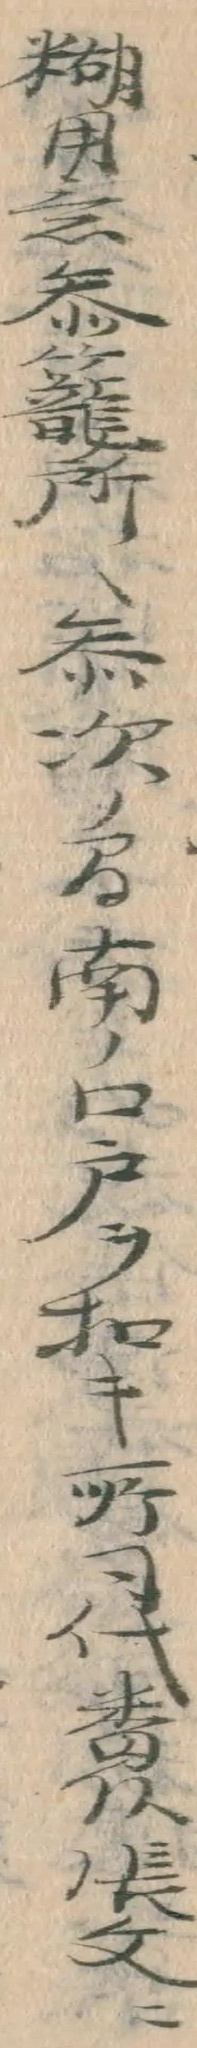糊用意参籠所へ参次ノ間南ノ口戸を扣キ所司代番頭張文に
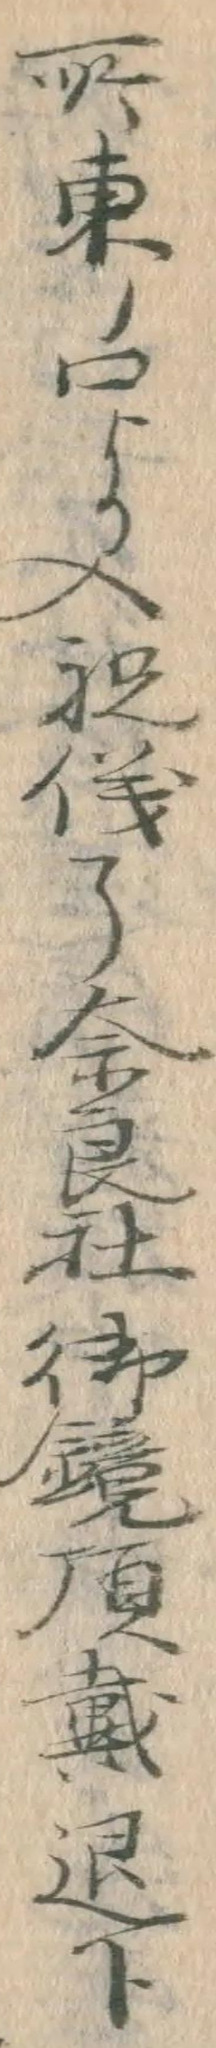所東ノ口より入祝儀了余良社御鏡頂戴退下
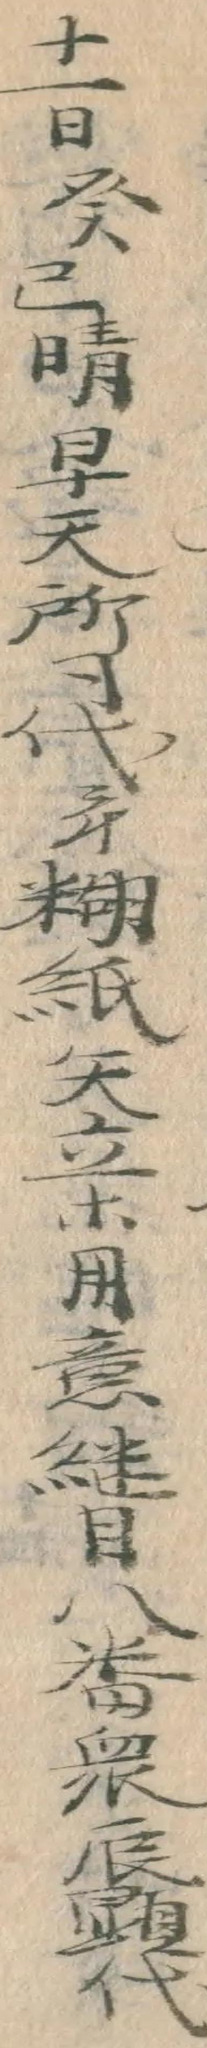十一日癸巳晴早天所司代ニ付糊紙矢立等用意継目八番衆辰顕代
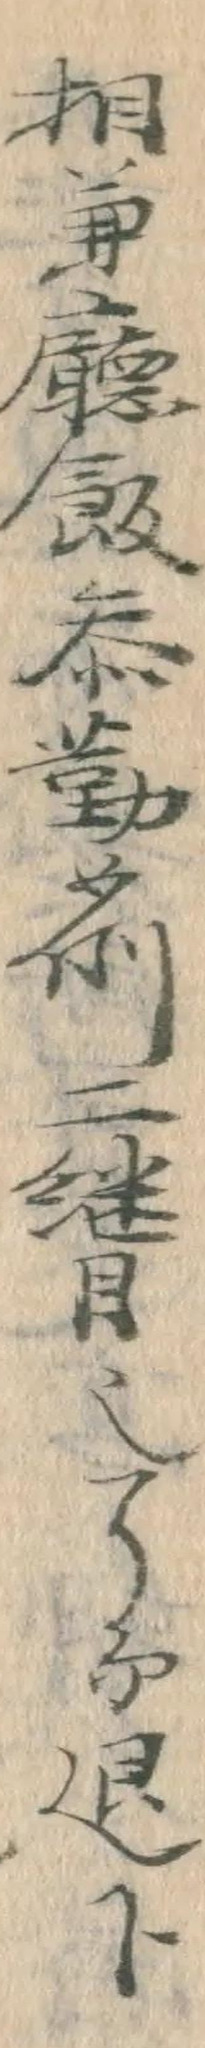相兼廳飯参勤如例二継目也了而退下
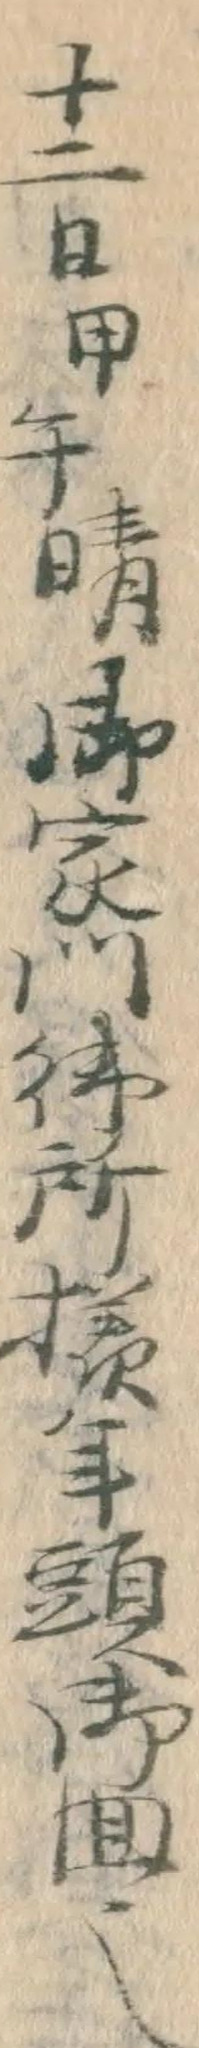十二日甲午晴御家門仏所様年頭御回也
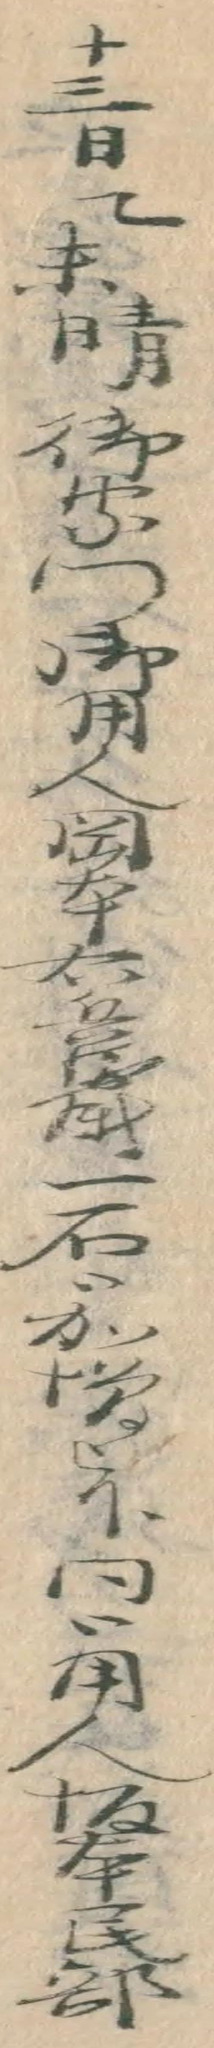十三日九未晴御家門御用人岡本右衛門尉一石御加増被下同御用人坂本民部
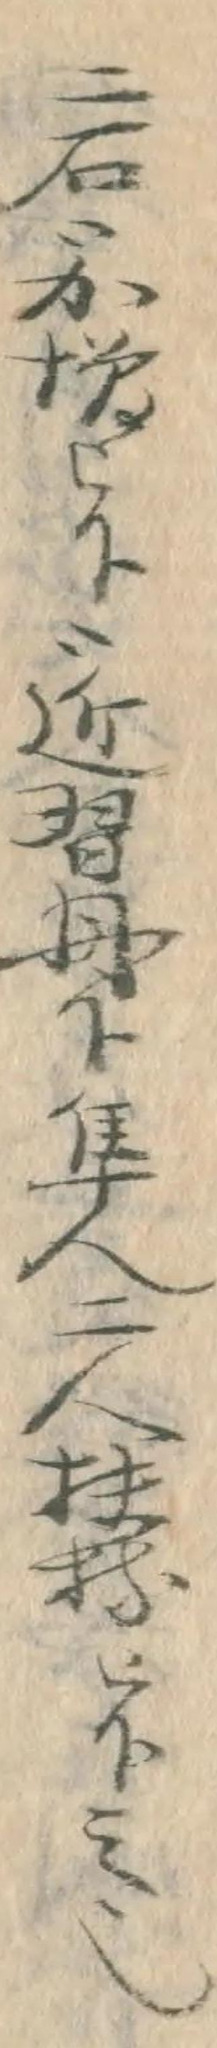二石御加増被下御近習丹下隼人二人扶持被下之也
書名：賀茂社記録. 第65冊
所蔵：国立国会図書館 National Diet Library, JAPAN
